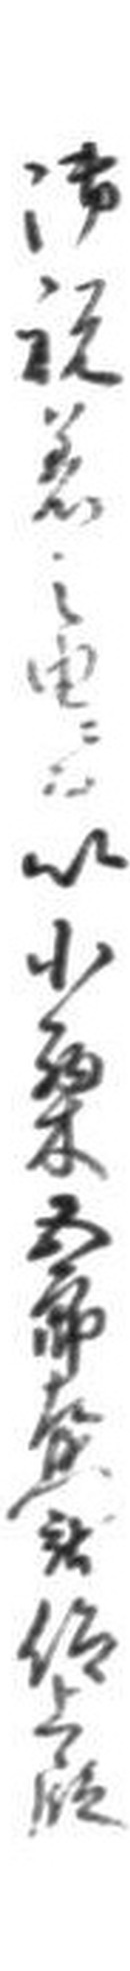御祝着之由ニ而以小栗五郎左衛門被仰上候段
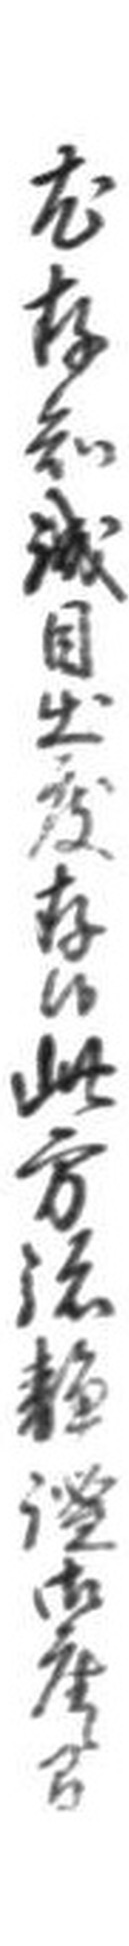尤存知誠目出度存候此方弥静謐御座候間
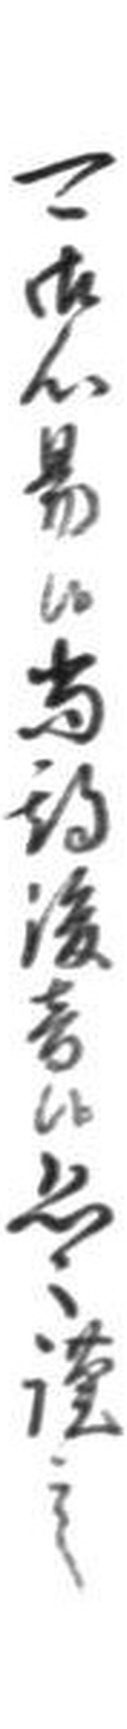可御心易候尚期後音候恐々謹言

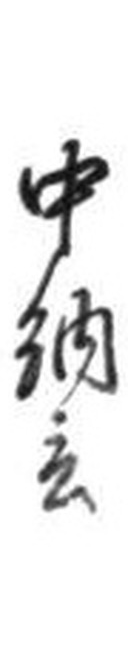中納言
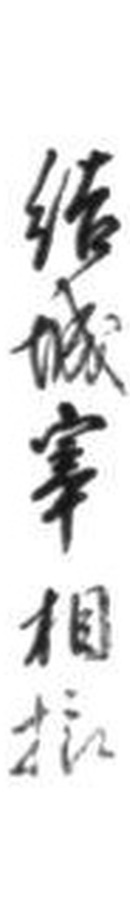結城宰相様
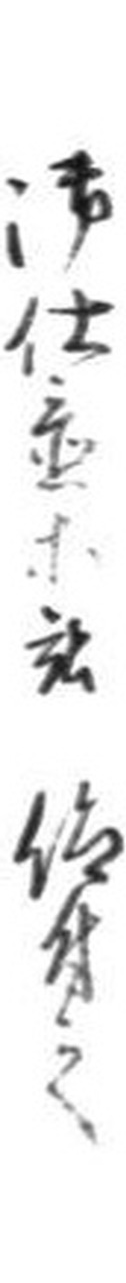御仕置等被仰付之
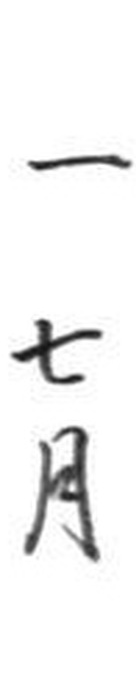一七月
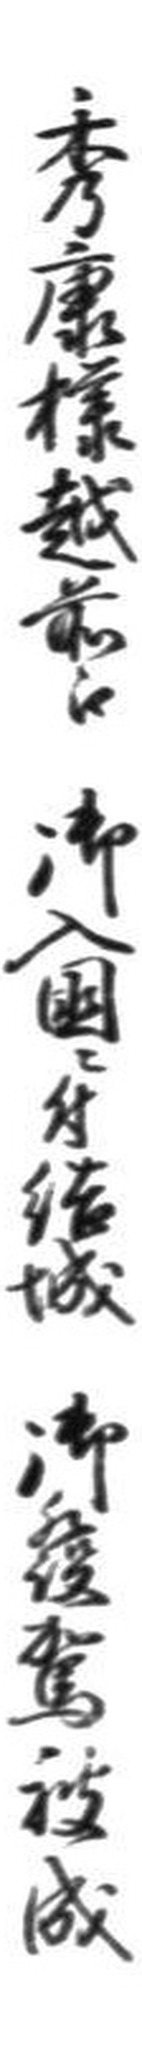秀康様越前江御入国ニ付結城御発駕被成
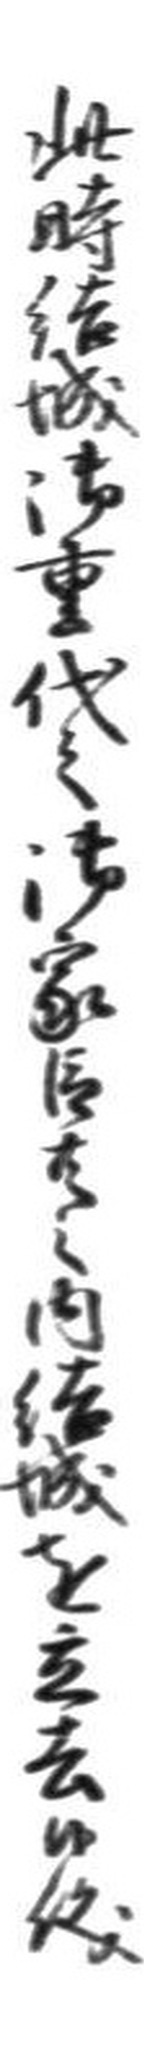此時結城御重代之御家臣共之内結城を立去候儀
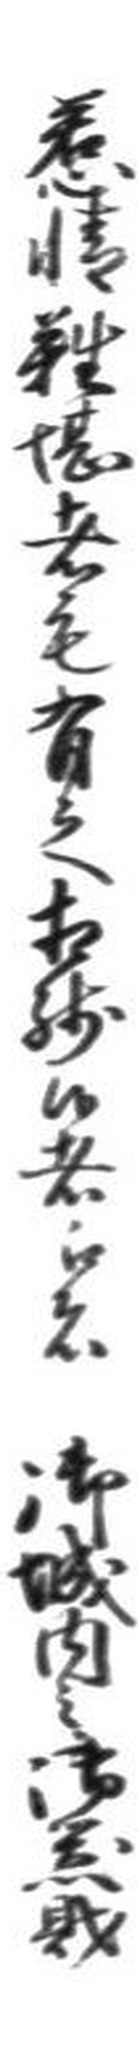惹情難堪者も有之相残候者江者御城内之御器財
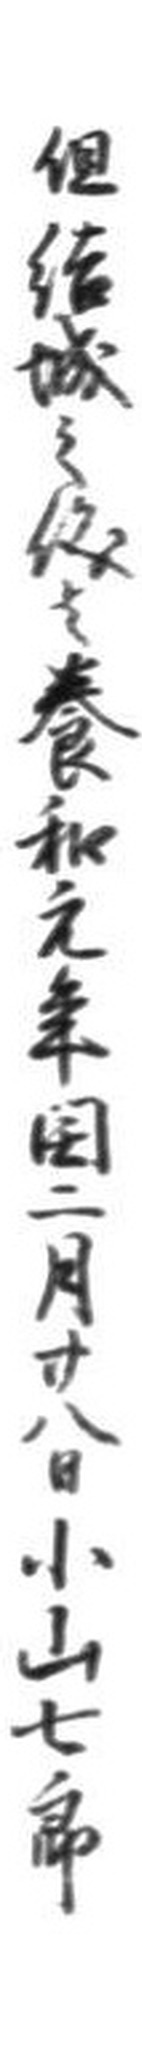但結城之儀者養和元年閏二月廿八日小山七郎
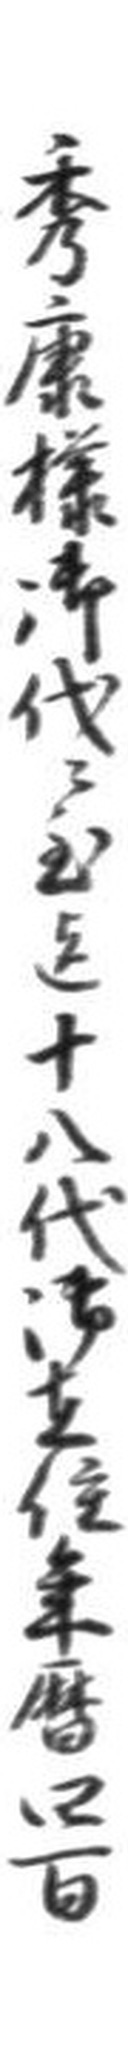秀康様御代ニ至迄十八代御在住年暦四百

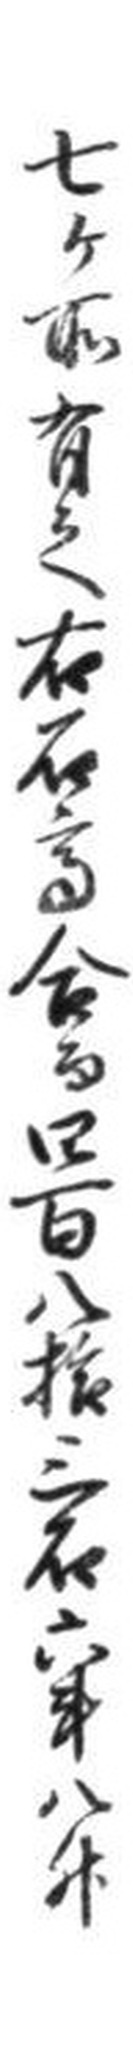七ヶ所有之右石高合而四百八拾三石六斗八升
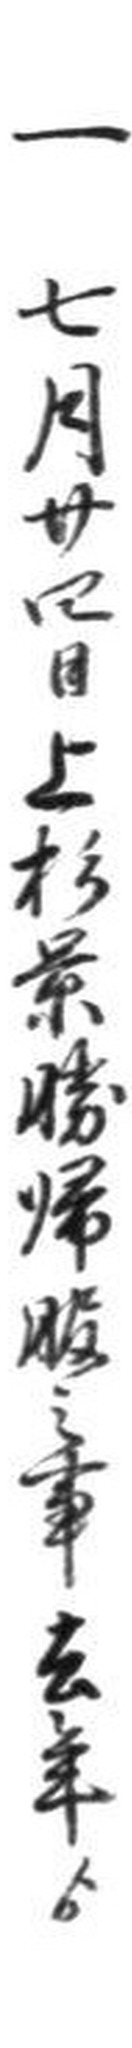一七月廿四日上杉景勝帰服之事去年ゟ
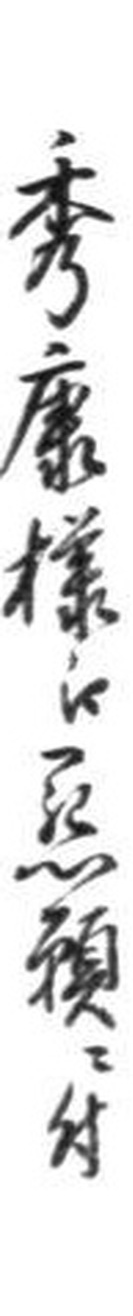秀康様江懇願ニ付
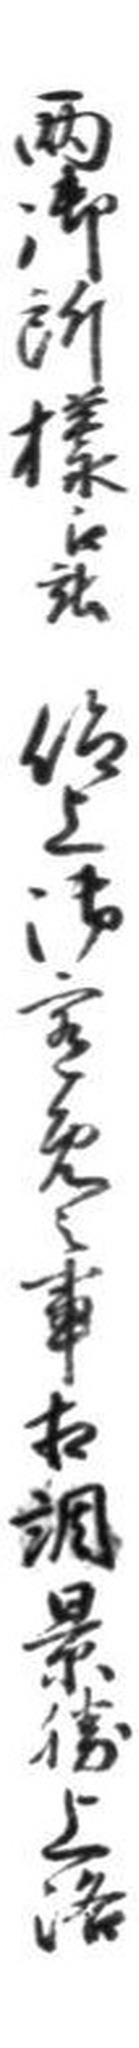両御所様江被仰上御宥免之事相調景勝上洛
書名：家譜 一 秀康公 従天正二年到慶長十二年
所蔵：福井県文書館 Fukui Prefectural Archives
